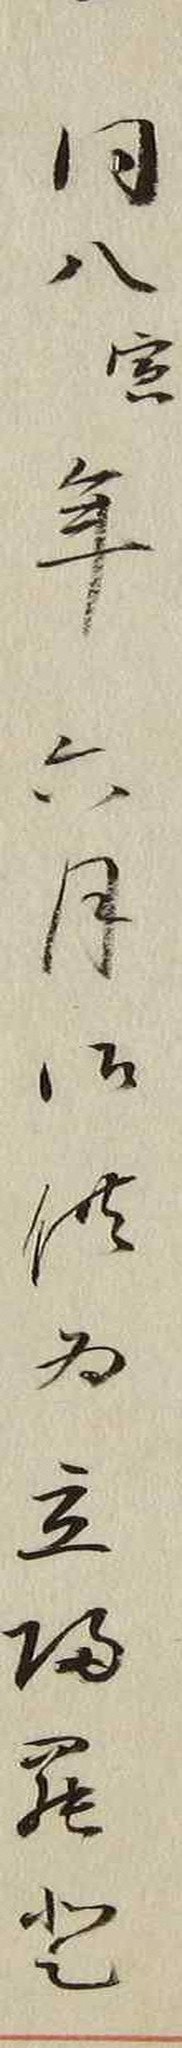一同八寅年六月御供為立帰罷登
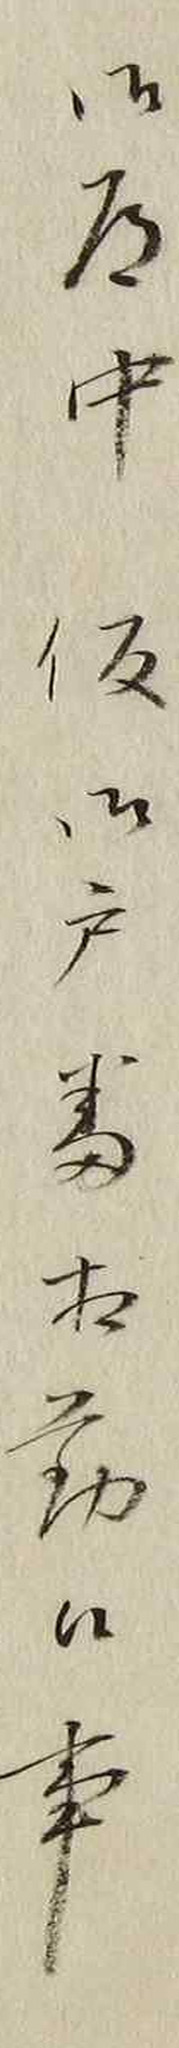御道中仮御戸番相勤候事
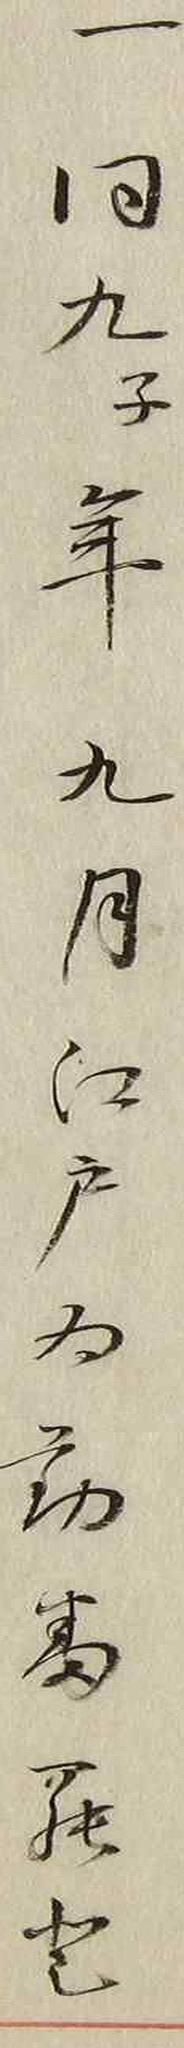一同九子年九月江戸為勤番罷登
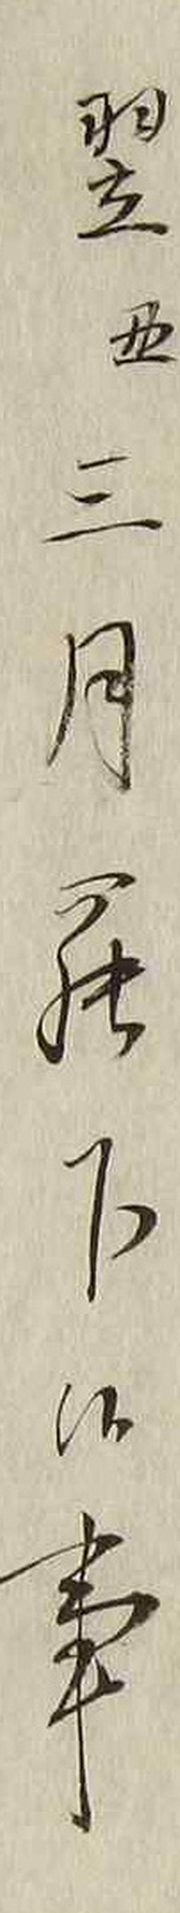翌丑三月罷下候事
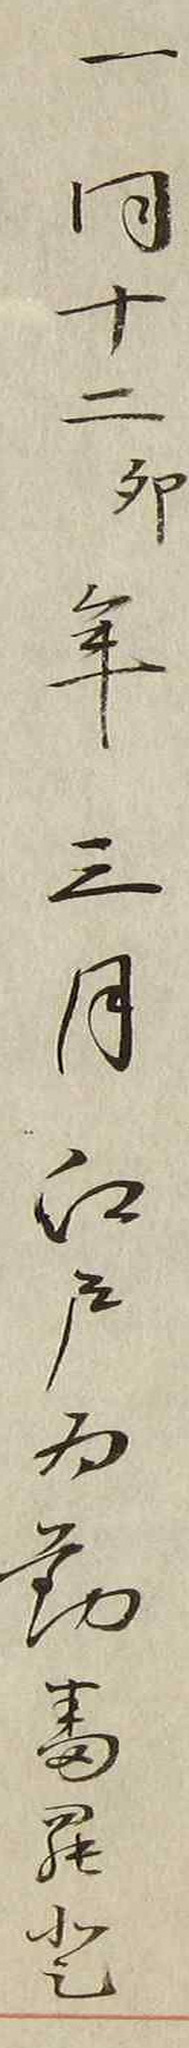一同十二卯年三月江戸為勤番罷登
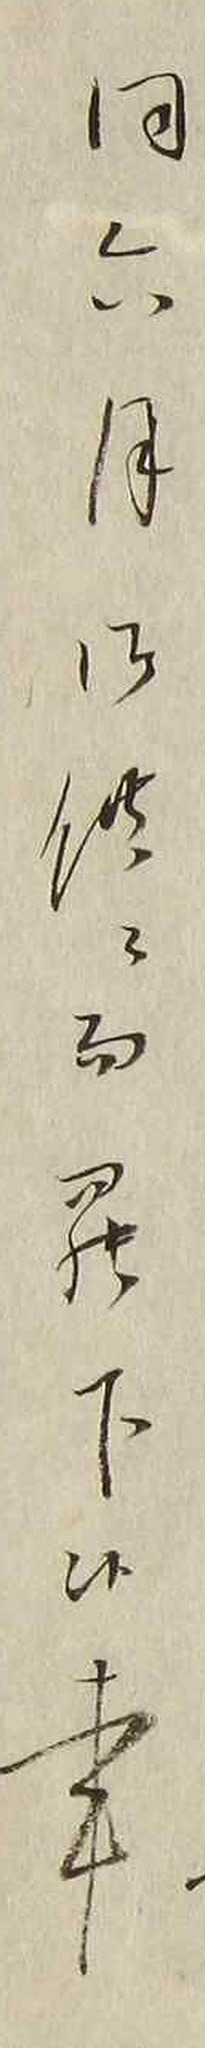同六月御供ニ而罷下候事
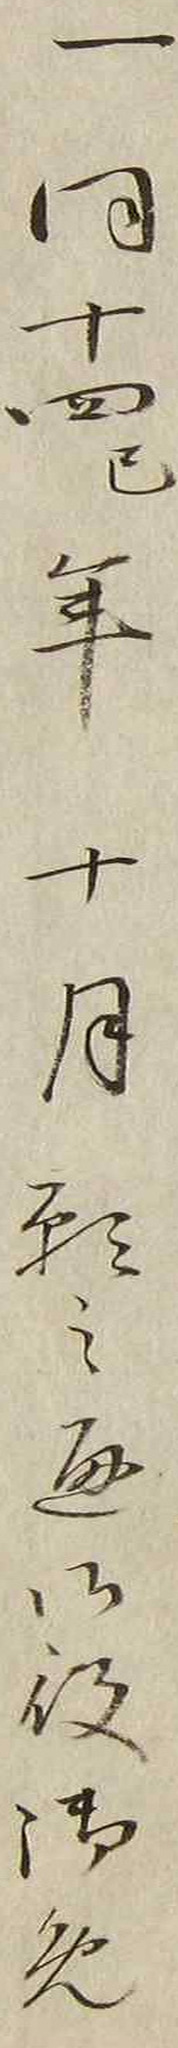一同十四巳年十月願之通御役御免

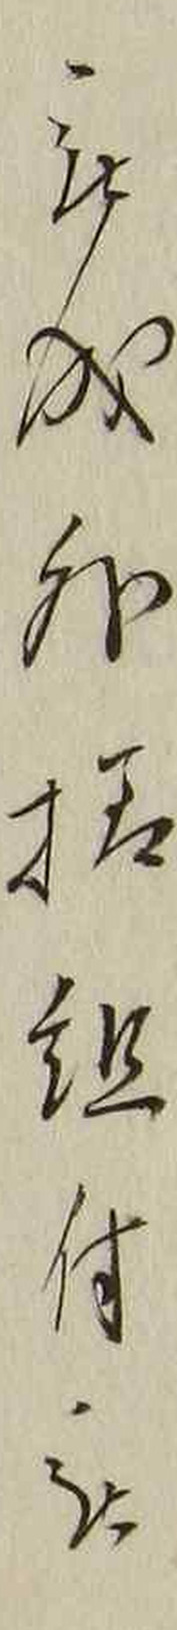被成外様組付被仰付山崎左助
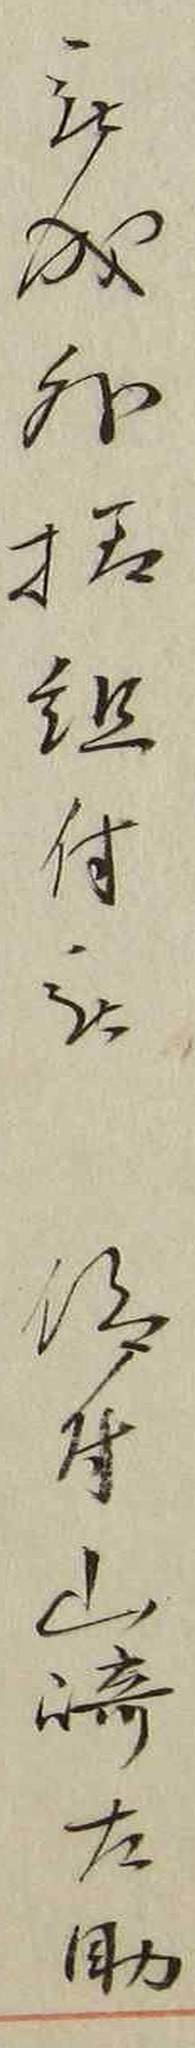被成外様組付被仰付山崎左助
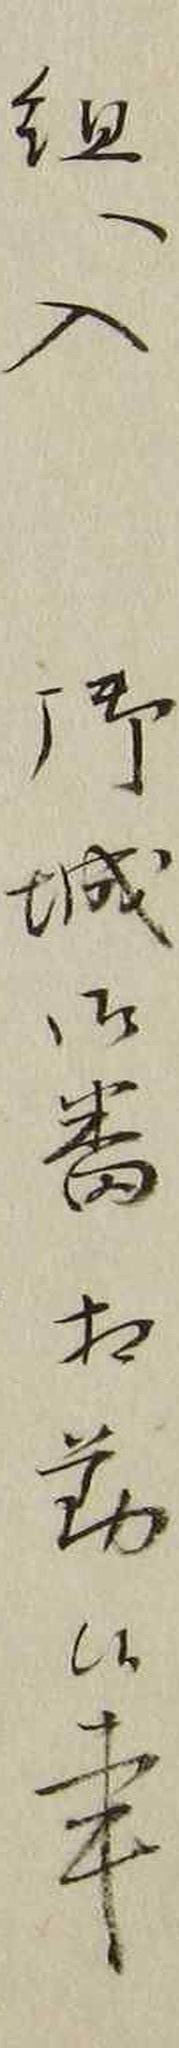組へ入御城御番相勤候事
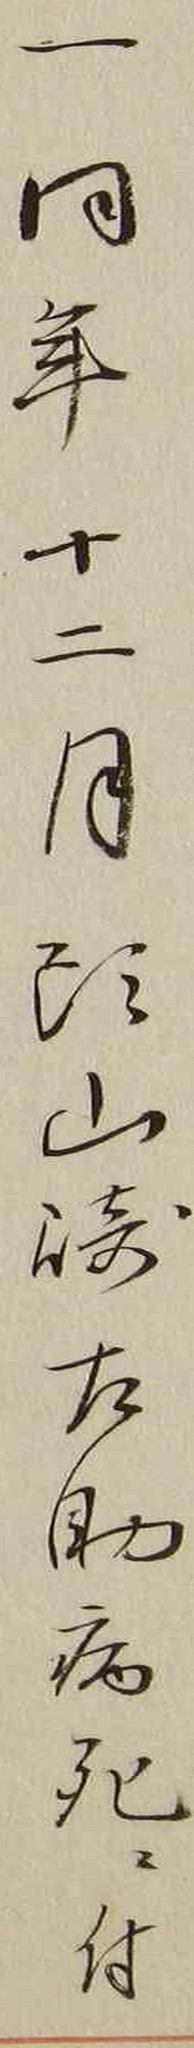一同年十二月頭山崎左助病死ニ付
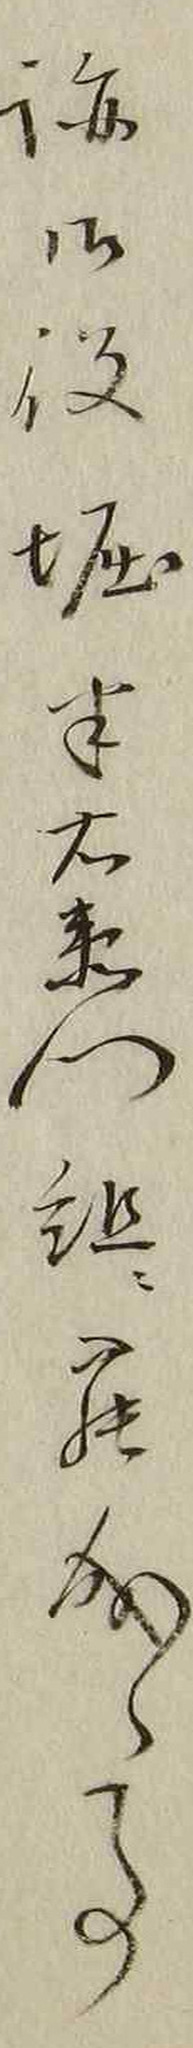跡御役堀半右衛門組ニ罷成候事
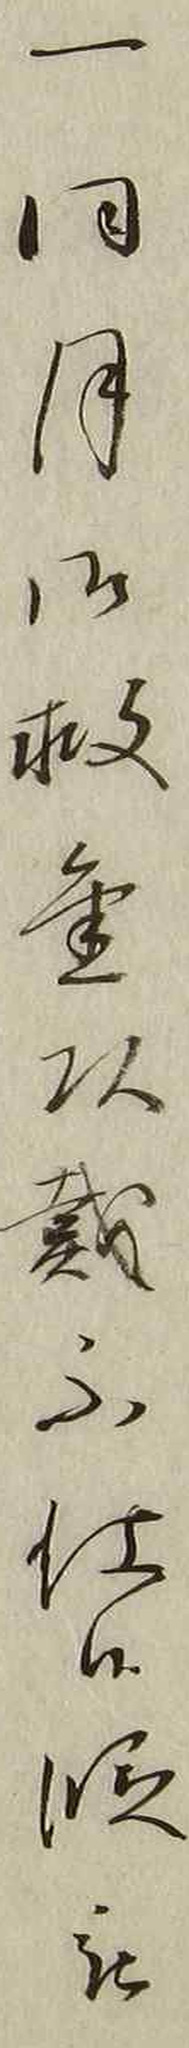一同月御救金頂戴不仕候段被
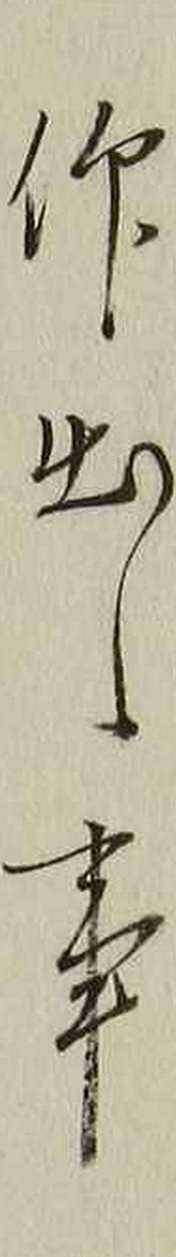仰出候事
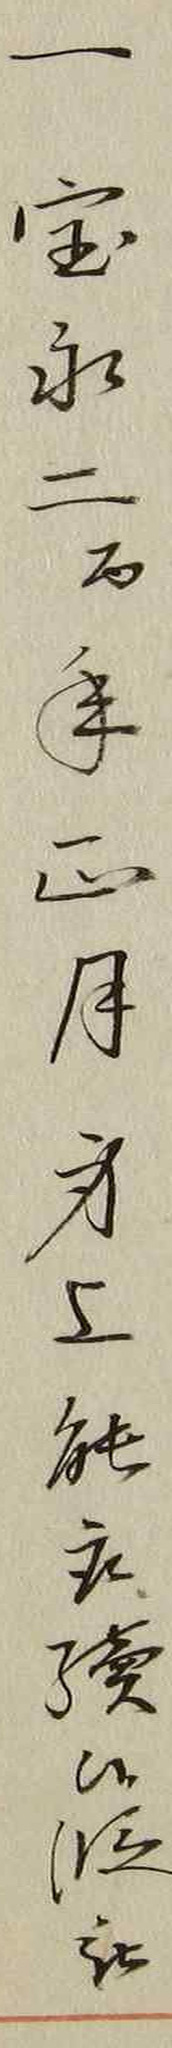一宝永二酉年正月身上能取続候段被
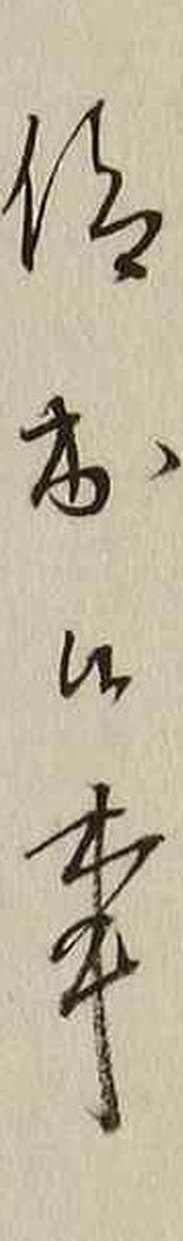仰出候事
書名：諸士系譜　巻之22　い之部22
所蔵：会津若松市立会津図書館
